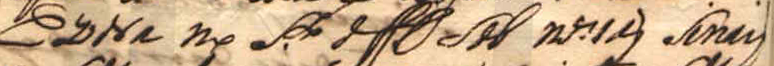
Evora no s.to offo sob nossos sinais
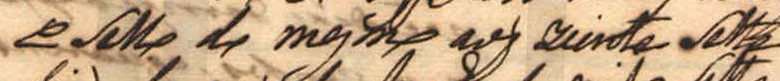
e sello do mesmo aos vinte sette
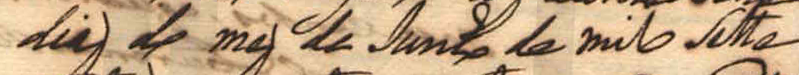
dias do mes de Iunho de mil sette
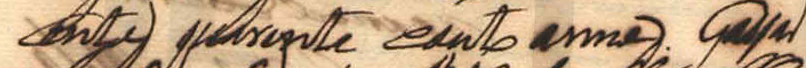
Centos quarenta e outo annos. Gaspar
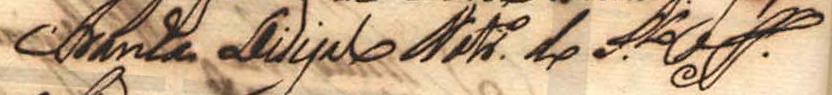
Aranha Vidigal Notr.o do S.to off.o
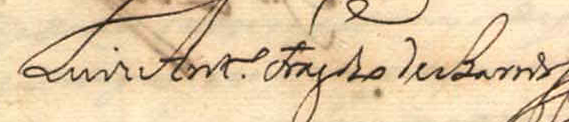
Luiz Ant.o Fragozo de Barros
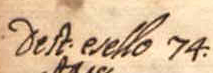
Dest. e sello 74.
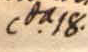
ct.a 18.
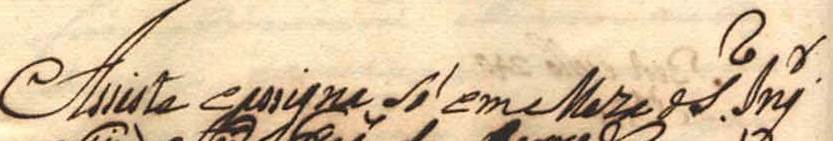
Assiste e o assigna só em Meza o s.ro Inqr.
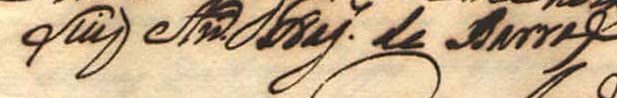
Luis An.to Frag. de Barros
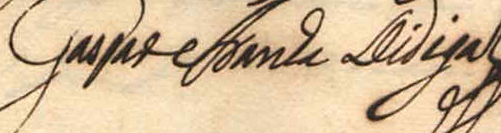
Gaspar Aranha Vidigal
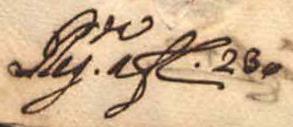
Reg.da a fl. 230
